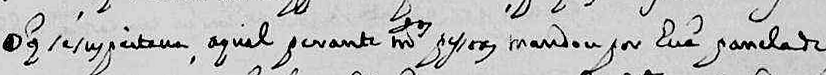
o q̄ se suspeitaua, a qual perante mtas pessoas mandou por huā panela de
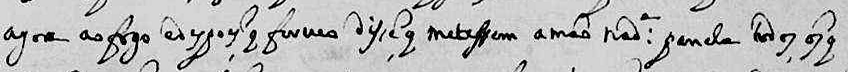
agoa ao fogo e despoes, q̄ ferueo disse, q̄ metessem a mão na d:a panela todos, os q̄
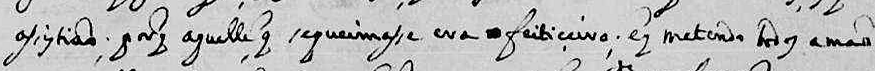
assistiaõ; porq̄ aquelle q̄ se queimasse era o feiticeiro; e q̄ metendo todos a maõ
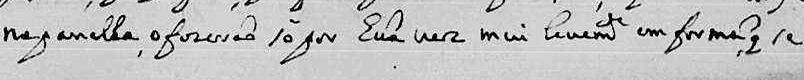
na panella, o fezessaõ só por huā uez mui leuemte em forma, q̄ se
